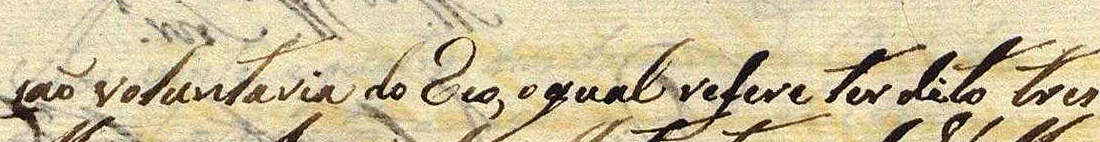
saõ voluntaria do Reo, o qual refere ter dito tres
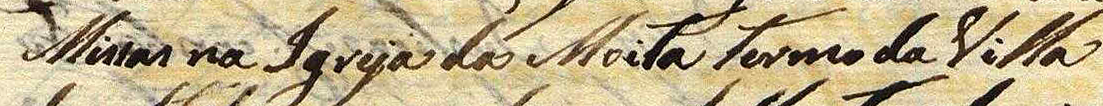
Missas na Igreja da Moita termo da Villa
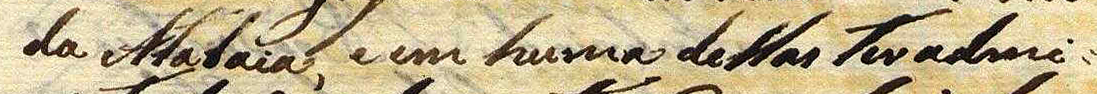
da Atalaia, e em huma dellas ter admi
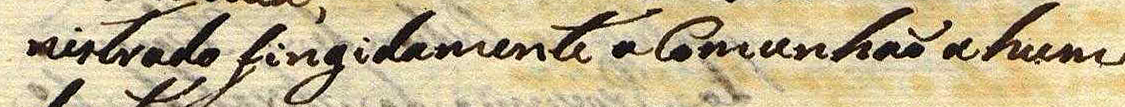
nistrado fingidamente a Comunhaõ a hum
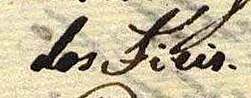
dos Fieis.
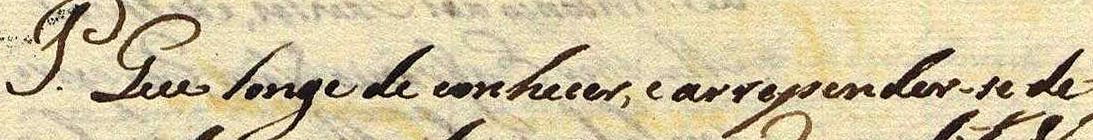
P. Que longe de conhecer, e arrepender-se de
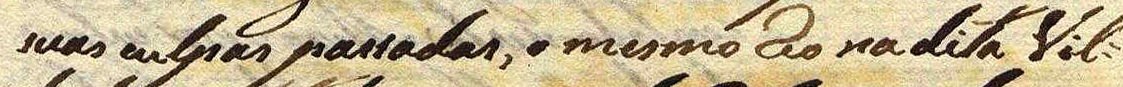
suas culpas passadas, o mesmo Reo na dita Vil
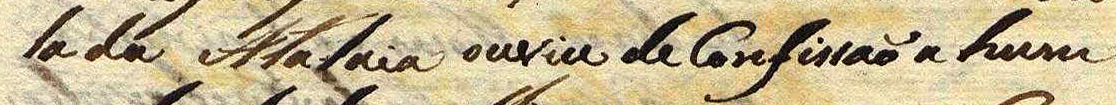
la da Atalaia ouviu de Confissaõ a hum
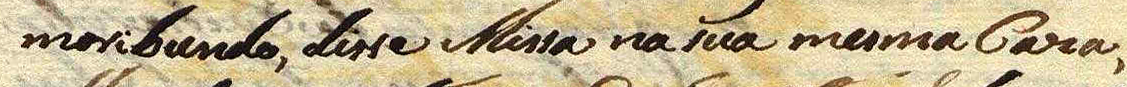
moribundo, disse Missa na sua mesma Caza,
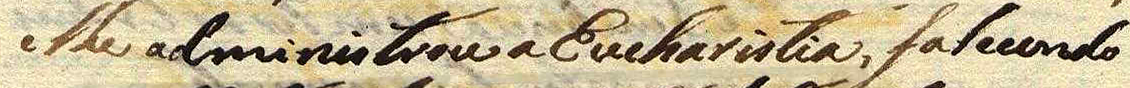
e lhe administrou a Eucharistia, falecendo
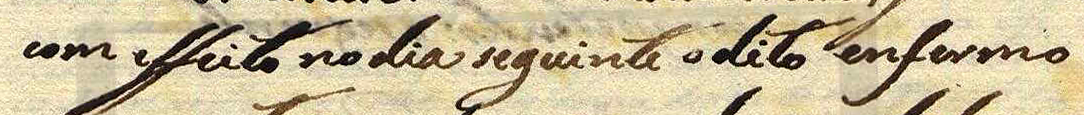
com effeito no dia seguinte o dito enfermo
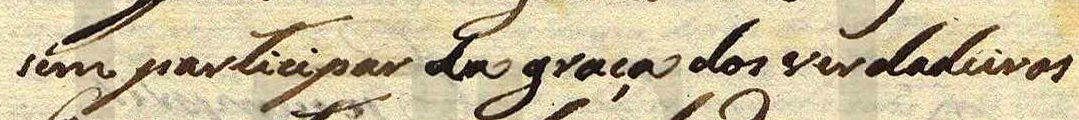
sem participar da graça dos verdadeiros
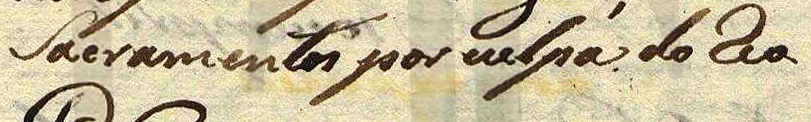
Sacramentos por culpa do Reo.
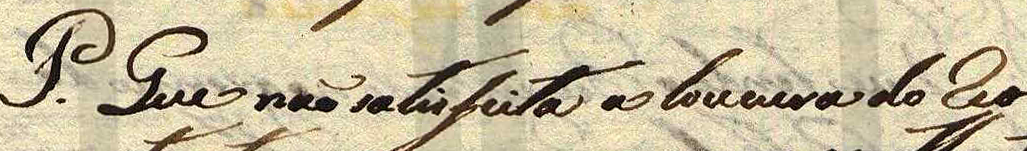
P. Que naõ satisfeita a loucura do Reo
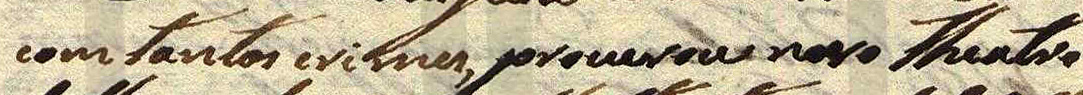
com tantos crimes, procurou novo theatro
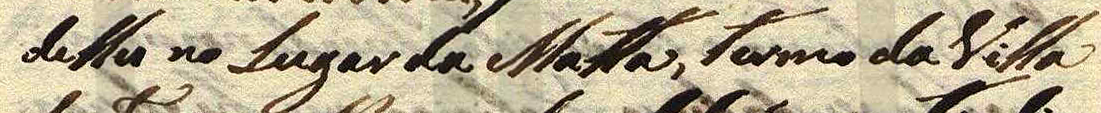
delles no Lugar da Matta, termo da Villa
